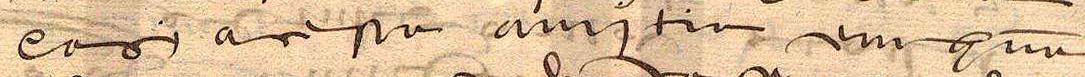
e asy acessa a mjtia em hūa
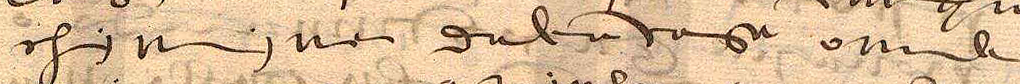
chymyne da dcā casa omde
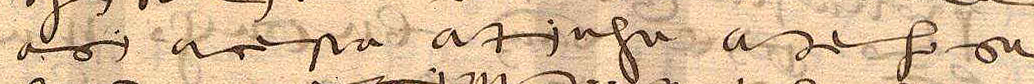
asy acessa a tynha ate ho sa
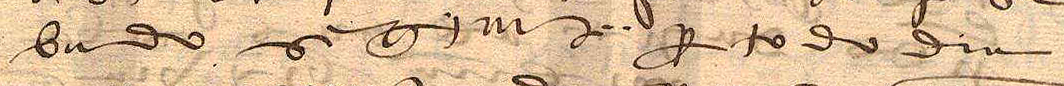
bado segymte ꝑ todo dia
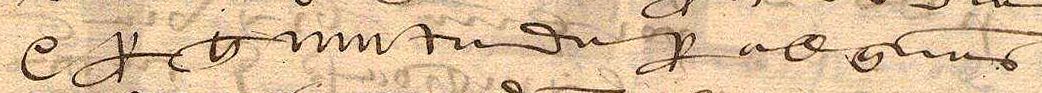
e ꝑgumtada ꝑ allguās
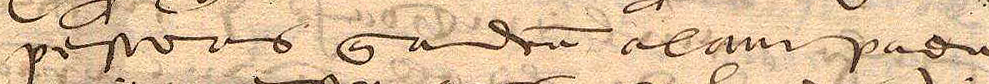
pessoas q̄ a dc̄a alampada
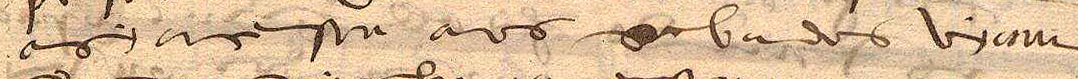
asy acessa aos sabados vyam
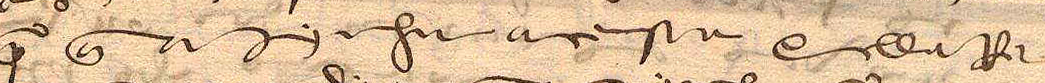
p̄o q̄ a tynha acessa e ella Re
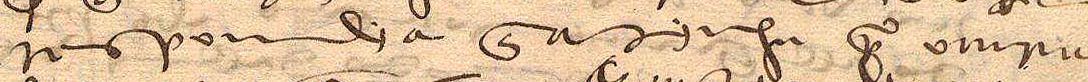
respondya q̄ a tynha p̄o omrra
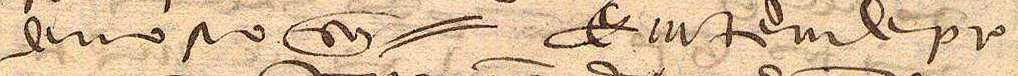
de nosso s̄or / Emtemde pro
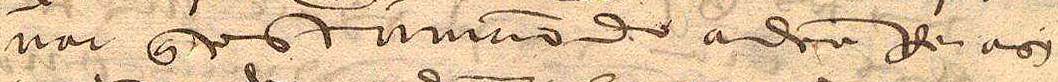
uar q̄ costumãodo a dc̄a Re asy
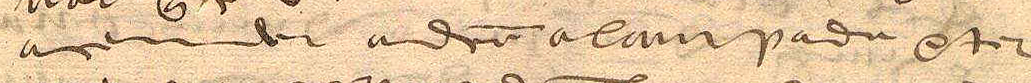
acender a dc̄a alampada e ter
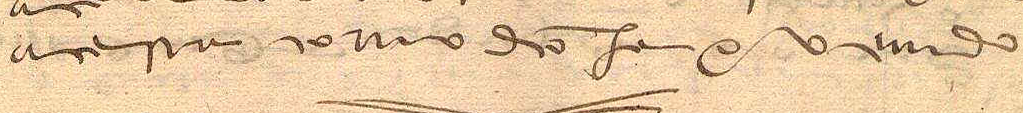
acessa como dt̄o he e vemdo
